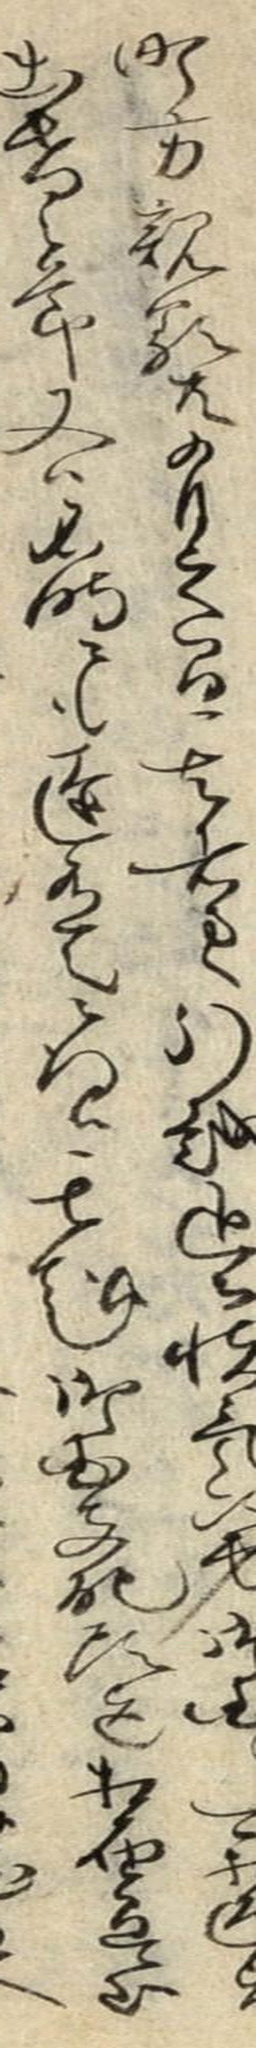出替之節又は不時にも達有之候得は其趣御国支配頭迄相届置候処
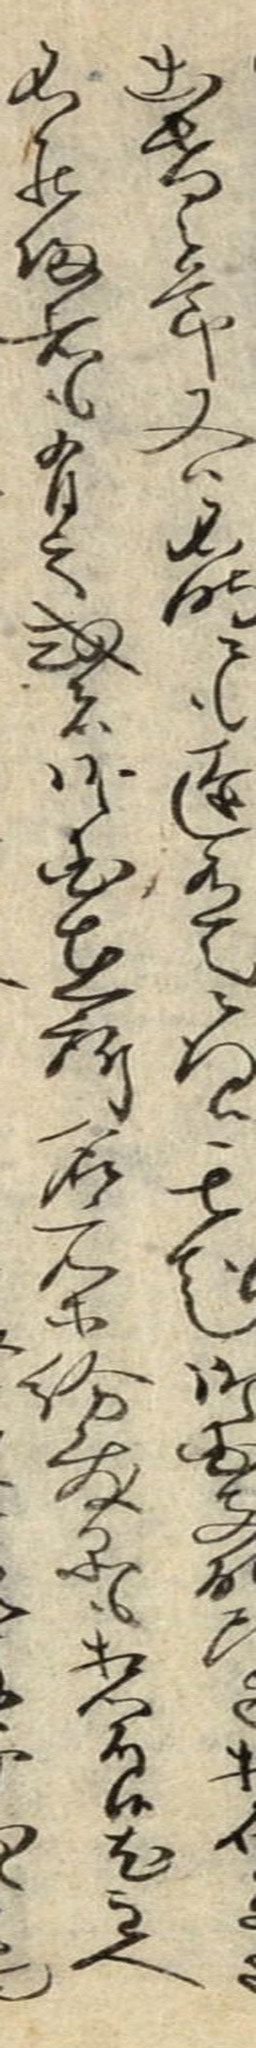不罷帰者も有之或は御国在所名元等紛敷品も相聞候尤主人
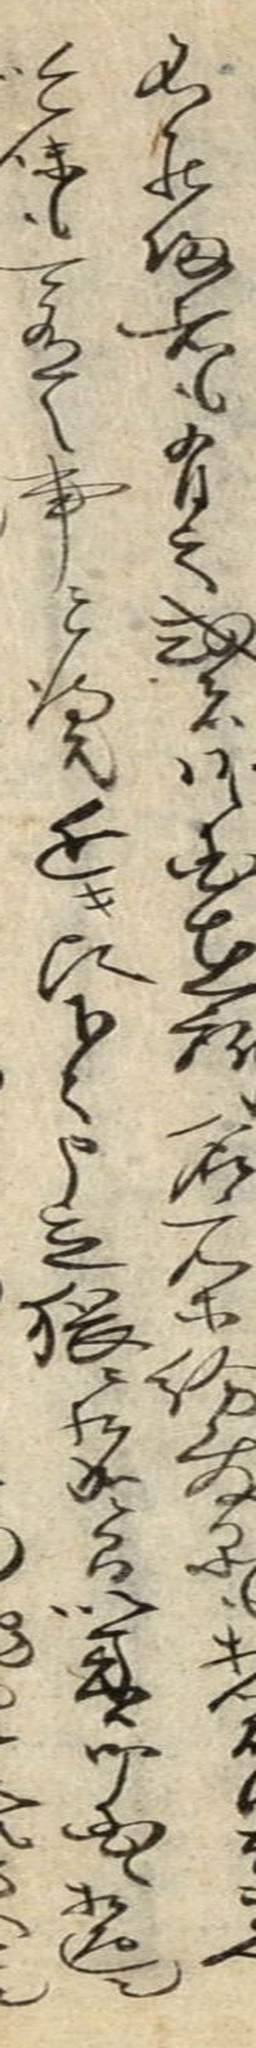吟味も可有之事に候得共近き頃下々申立猥に相成候間以来御国へ相返し
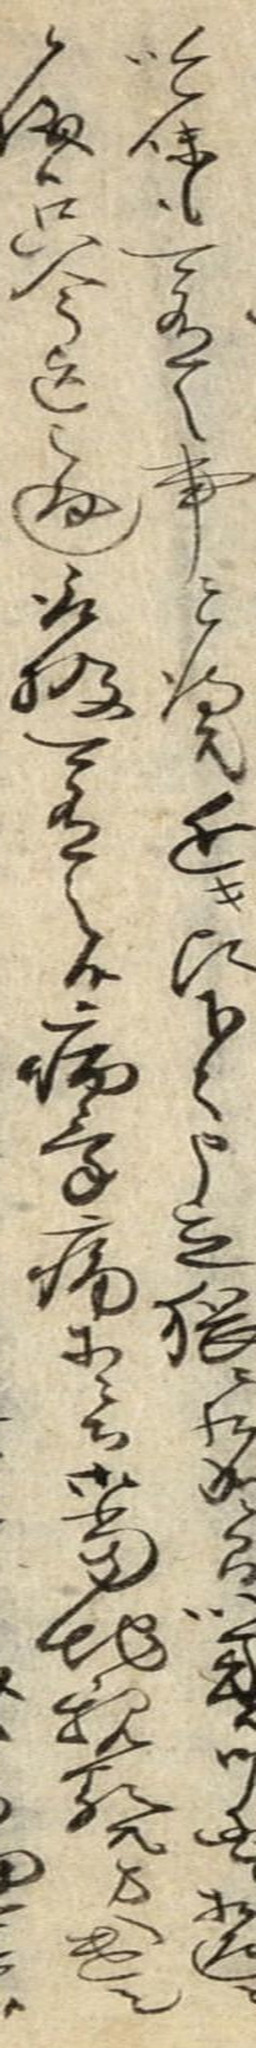候儀は只今迄之通取扱可有之候病気痛等にて御当地親類共方へ遣し
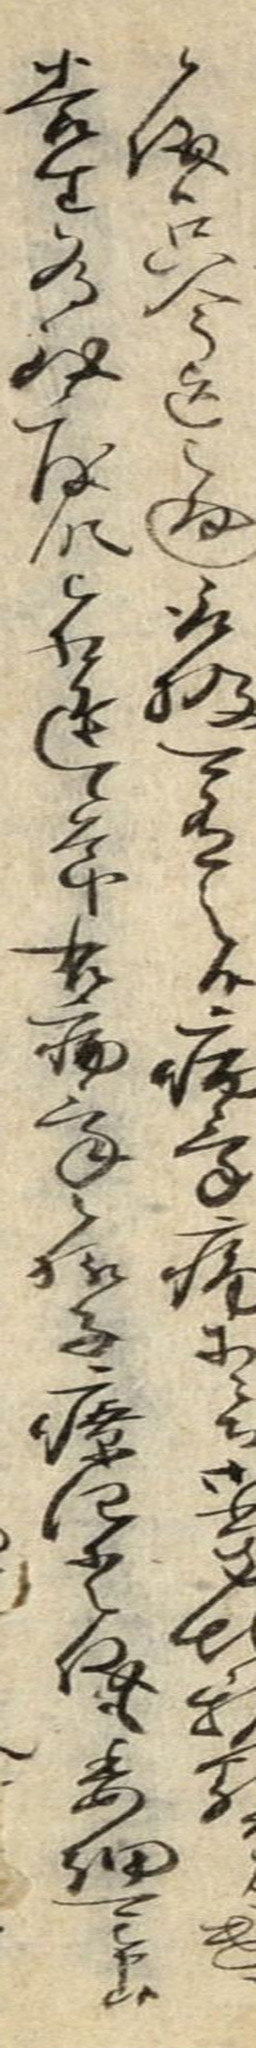養生為致度段被相達候節右病気之様子療治等之儀も委細可被申候
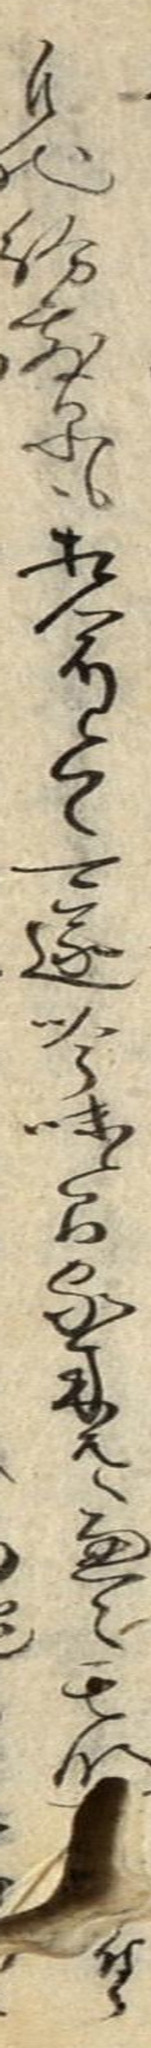自然紛敷品も相聞候はゝ可遂吟味候間家来共へ兼々其段付候
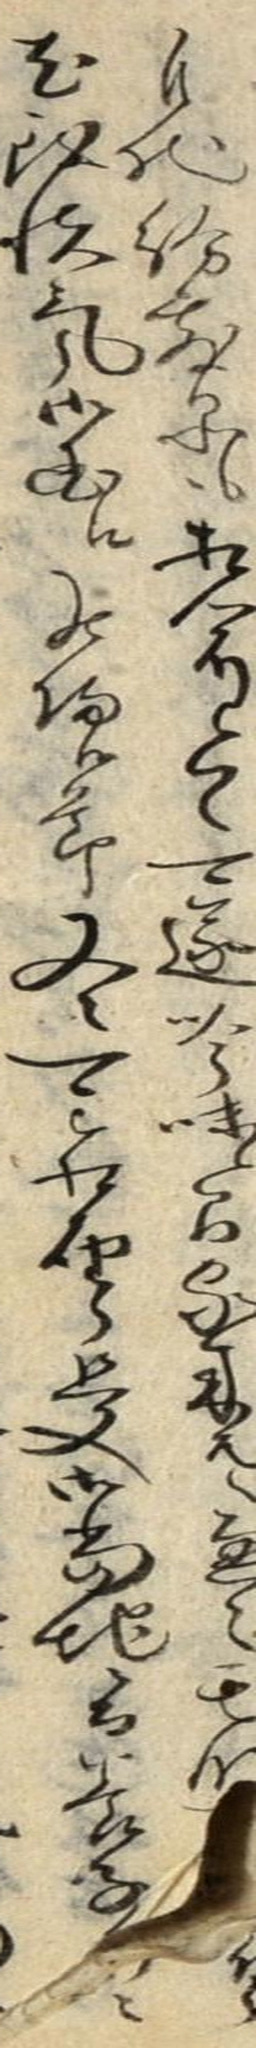尤致快気御国江罷帰候節又々可被相届候且又御当地にて養子に
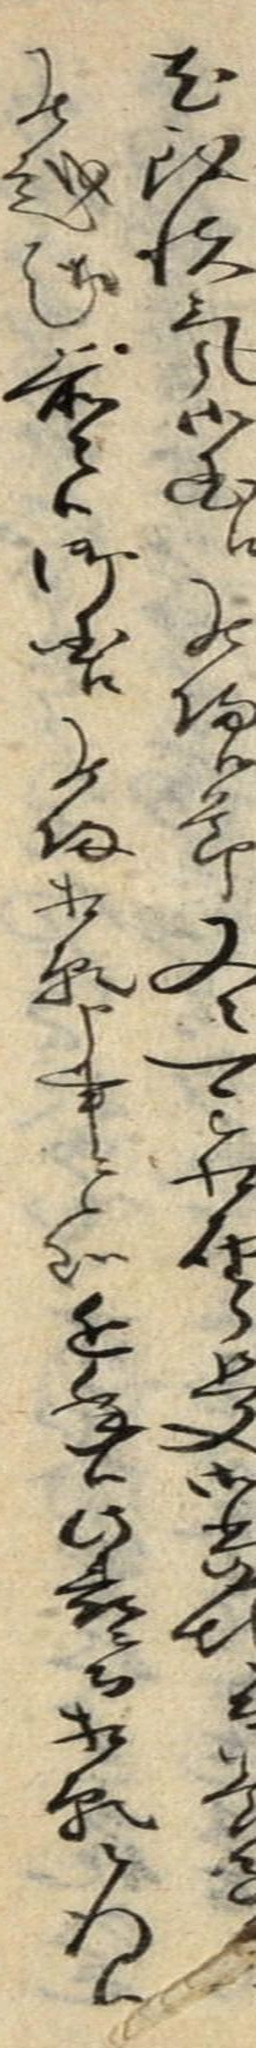罷越趣前々は御国江罷帰相願申事に候処近年は此表にて相願候得は

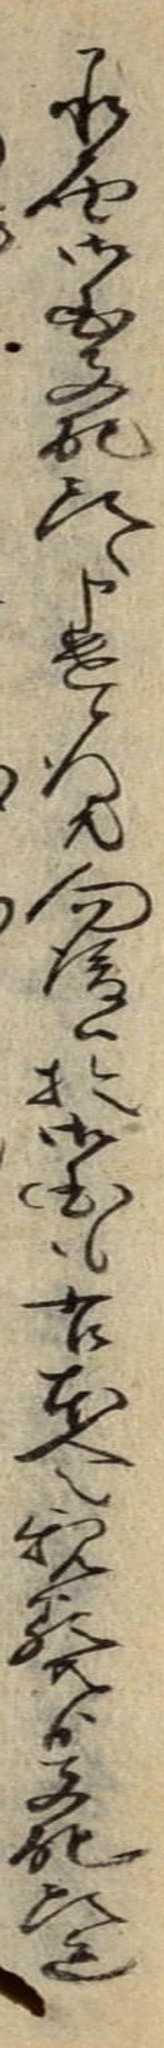承届御国支配頭へ申遣候得共向後は於御国も右本人之親類共ゟ支配頭迄
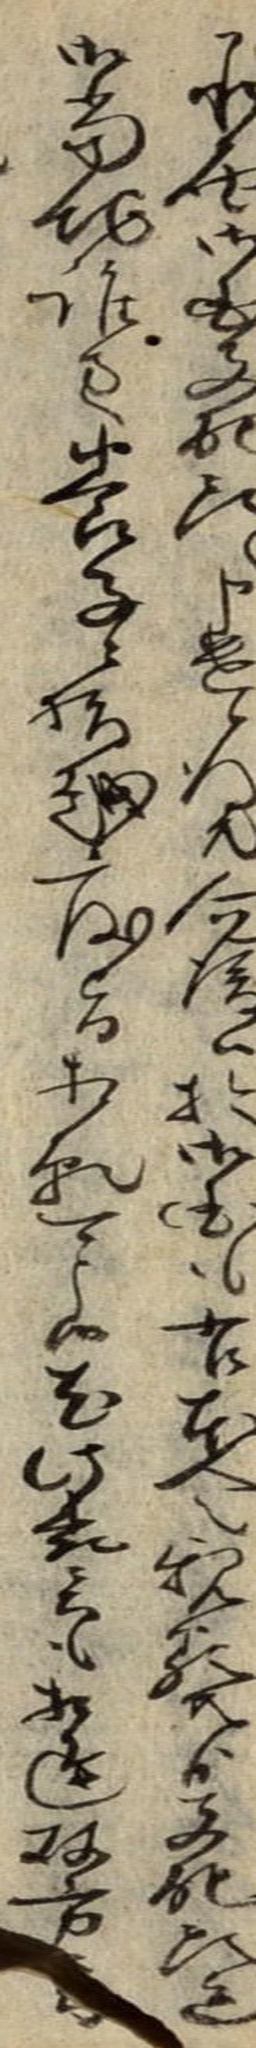御当地誰方へ養子に指越度旨相願可申候尤此表にても相達双方にて
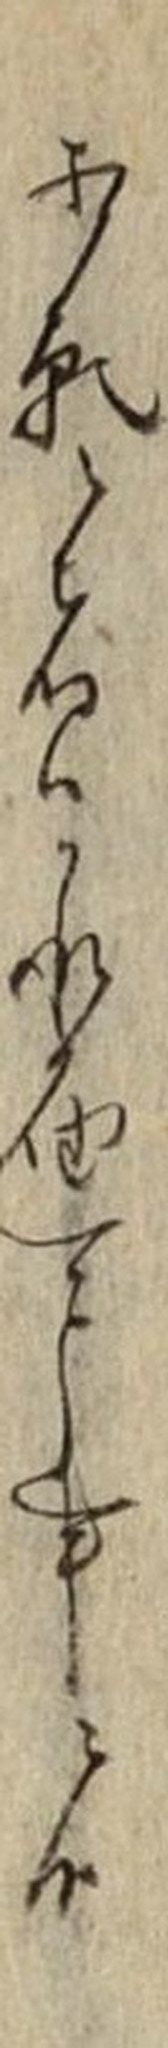相願候者は承届可申事に候
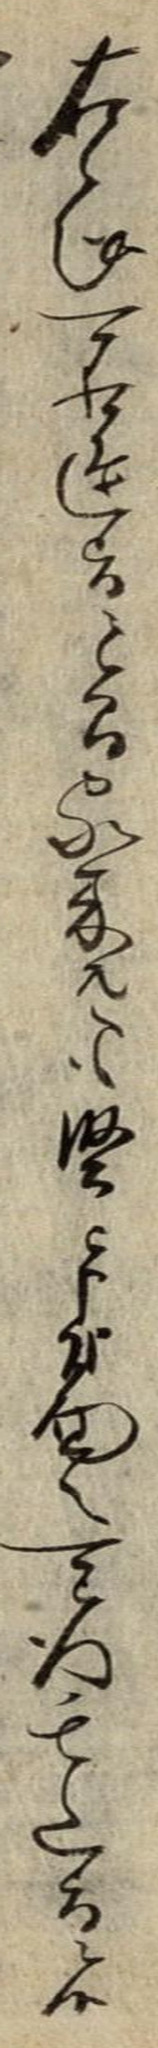右之趣可相達旨に候間家来共へも堅被申付可被得其意旨に候
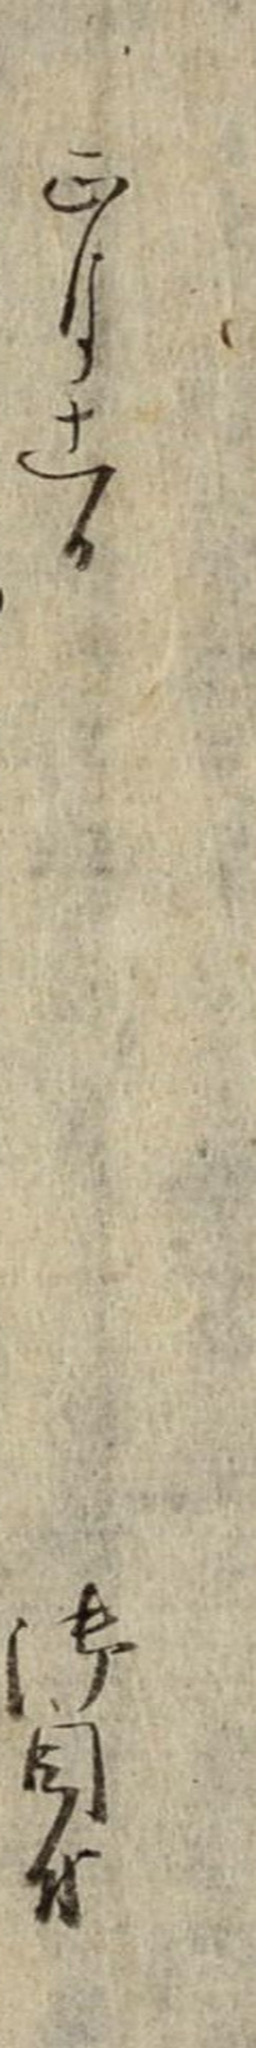正月十一日御目付
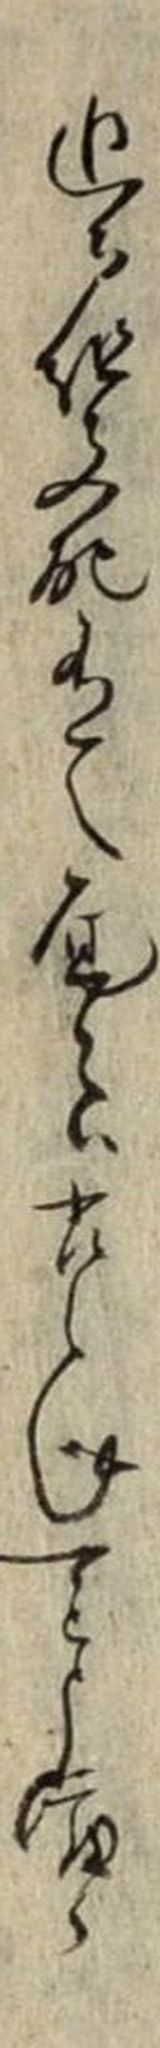追て組支配有之面々は右之趣可被申渡候
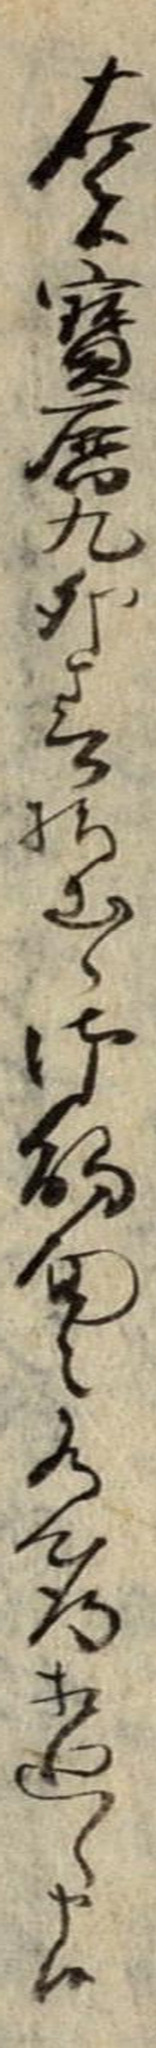右は宝暦九卯春指出候御触面々為心得相廻し申候
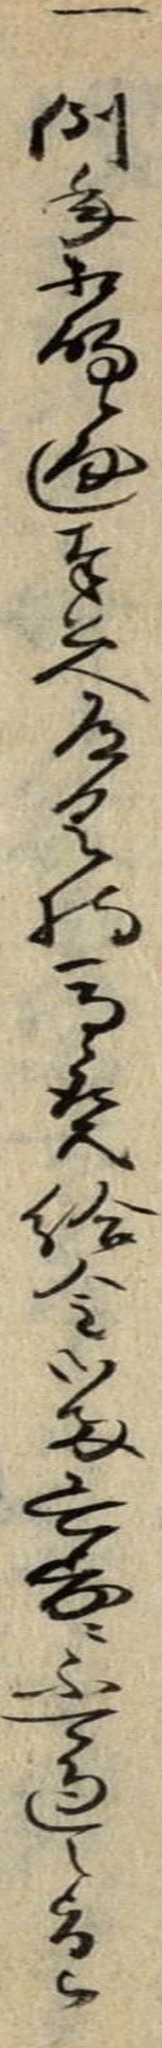一例年相触候通奉公人道具持馬取共給金弐両壱歩に不可過之旨被
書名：三都并道中之部
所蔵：福井県文書館 Fukui Prefectural Archives
